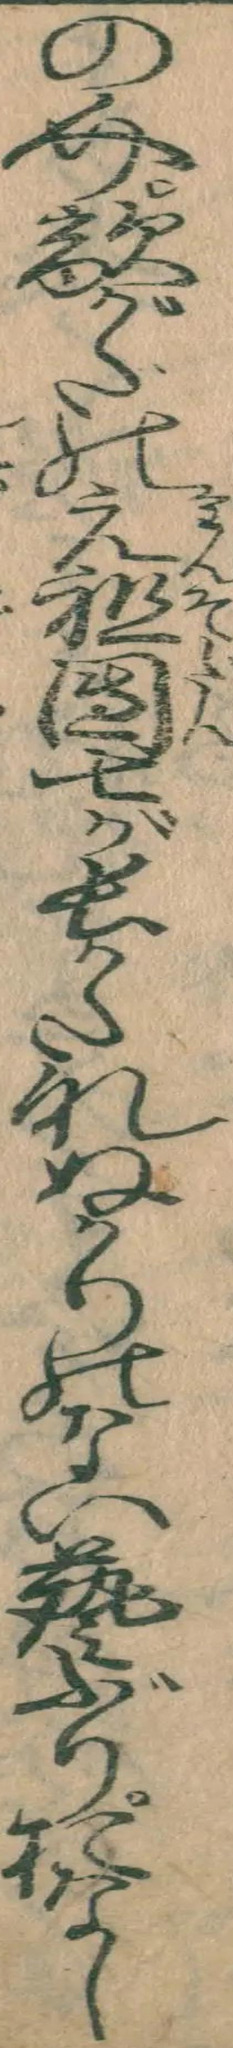の介。敵がたの元祖団七が長かたなぬかりのない芸ぶり。おなし
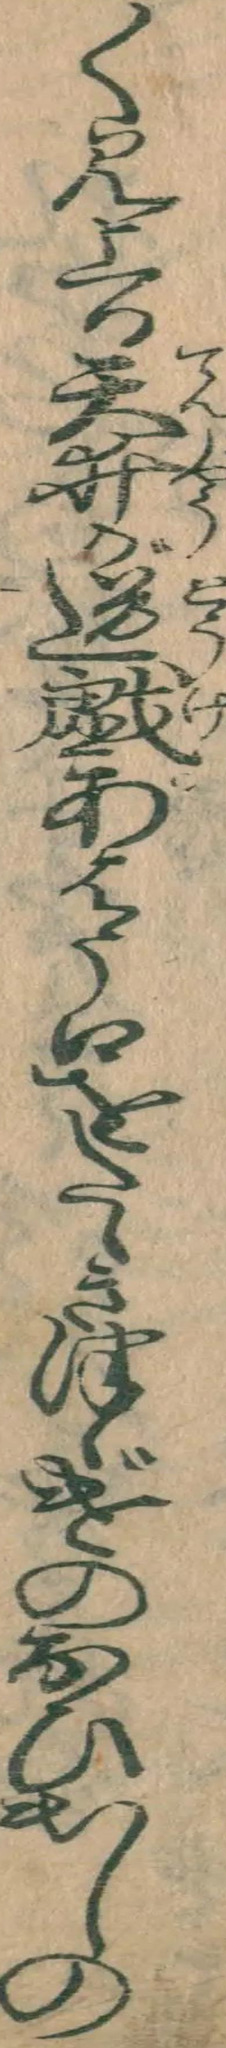く見上る天井が道戯あはう口をたゝきつゞけのおひ出しの
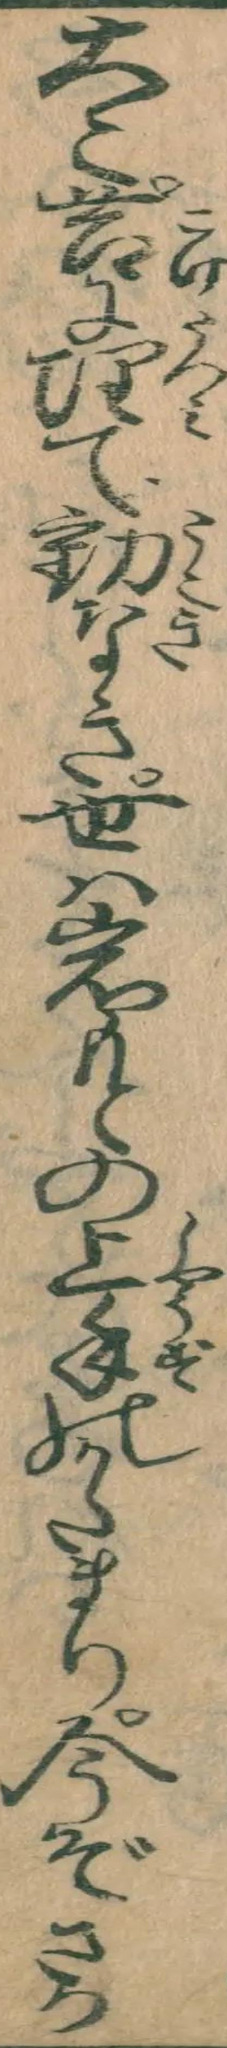大こ。苔に埋て動なき。世は岩もとの上手のかたまり。今ぞさか

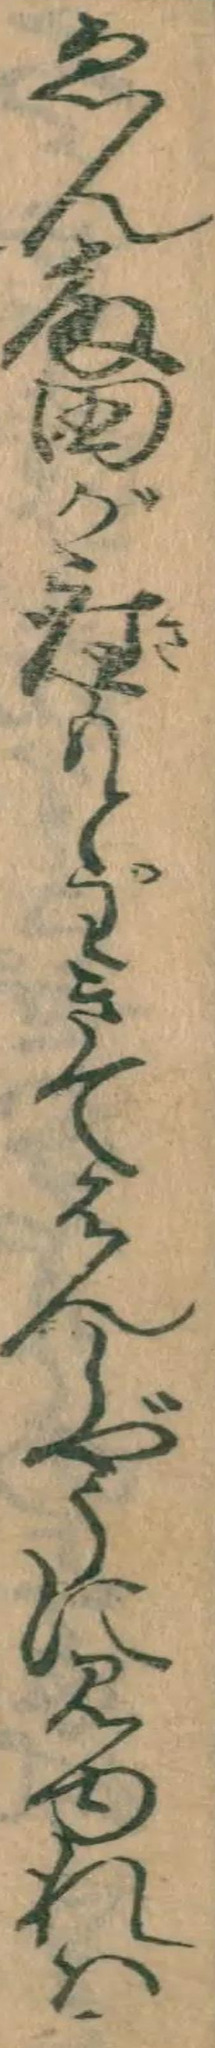ゑん藤田が座もと。わきてはんじやうに見ゆれは
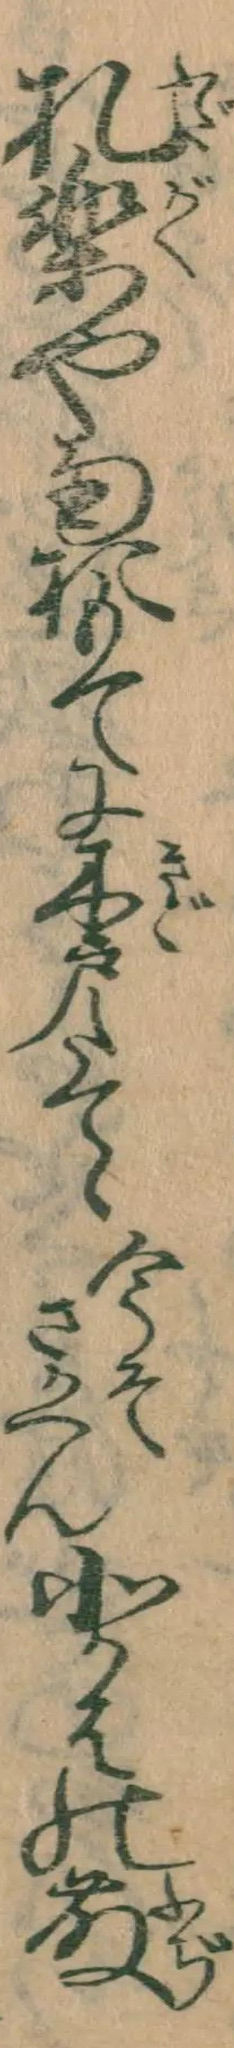札楽や南おもてに木戸たてゝ今そさかへん北かはの藤
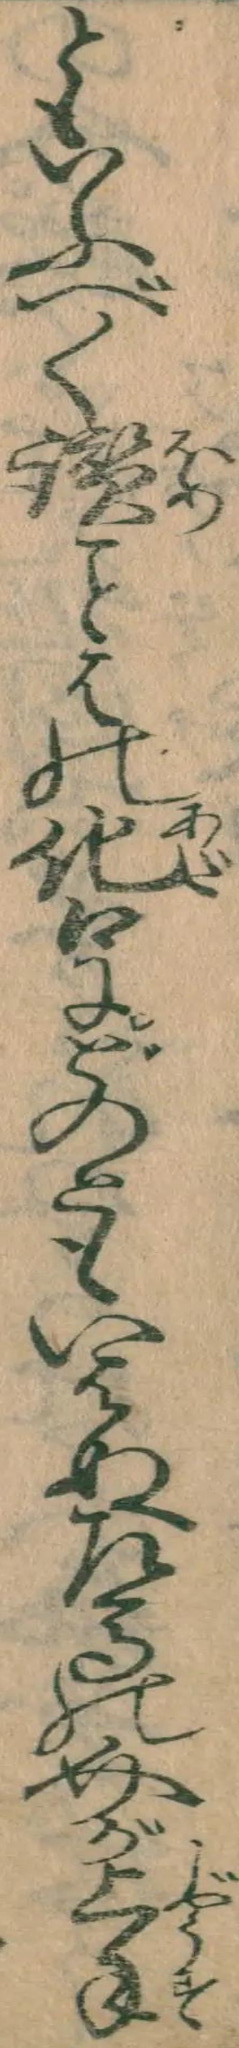ともいふべ〱讃ことはの化口に。どのともいはぬ左馬の介が上手
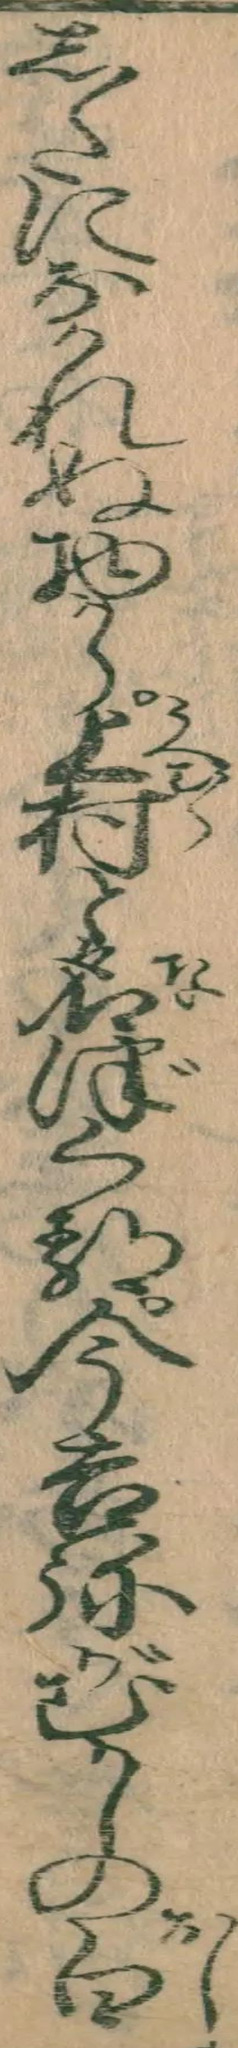したにおかれぬ物から。上村と名づくる。今吉弥がむかしの白
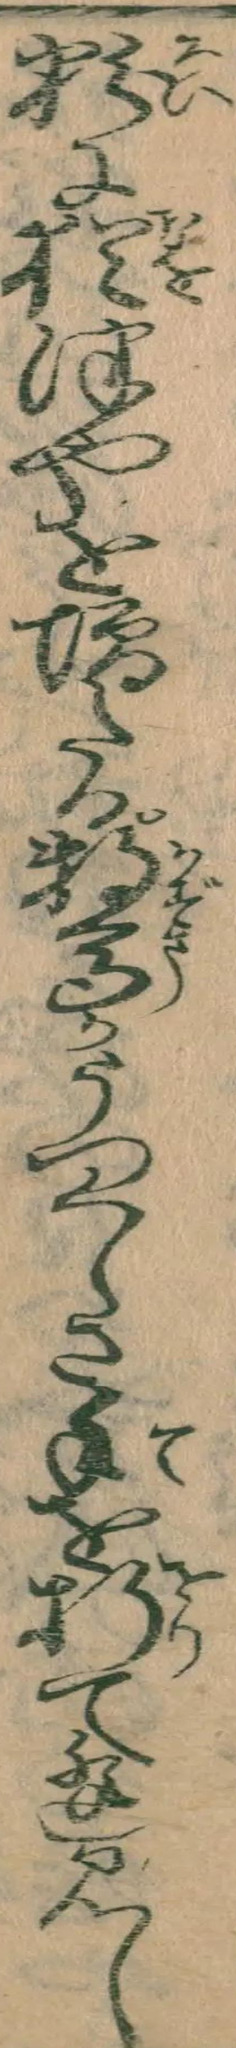粉に猶つやを増たる。数馬かうつくしき手を折て逢見し
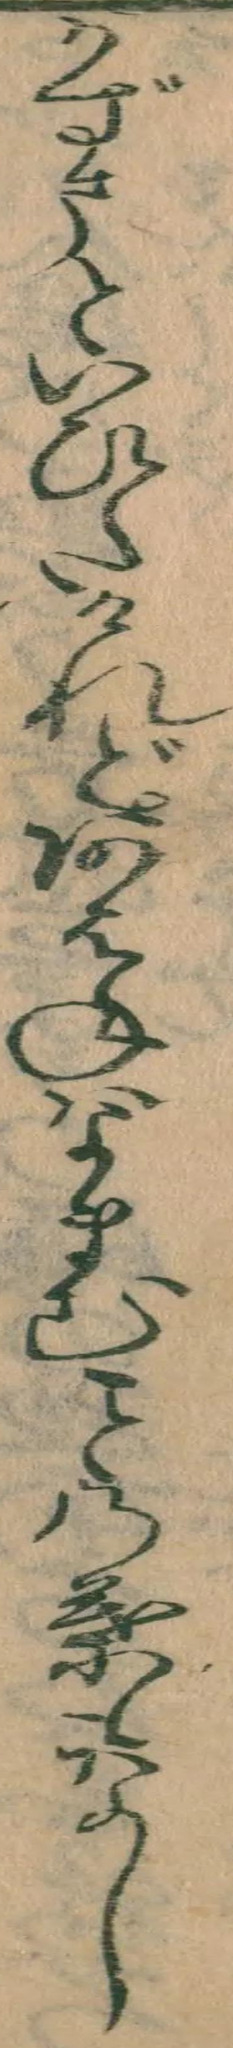かずまといひたけれど。あはねはよまむことの葉もなし
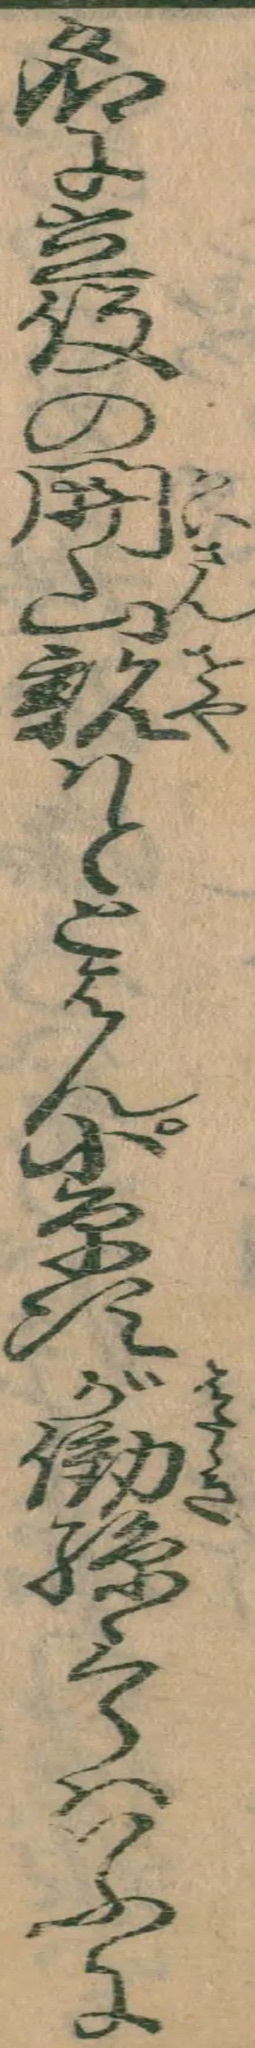名に立役の開山親はととはん。小平次が働孫三郎はいふに
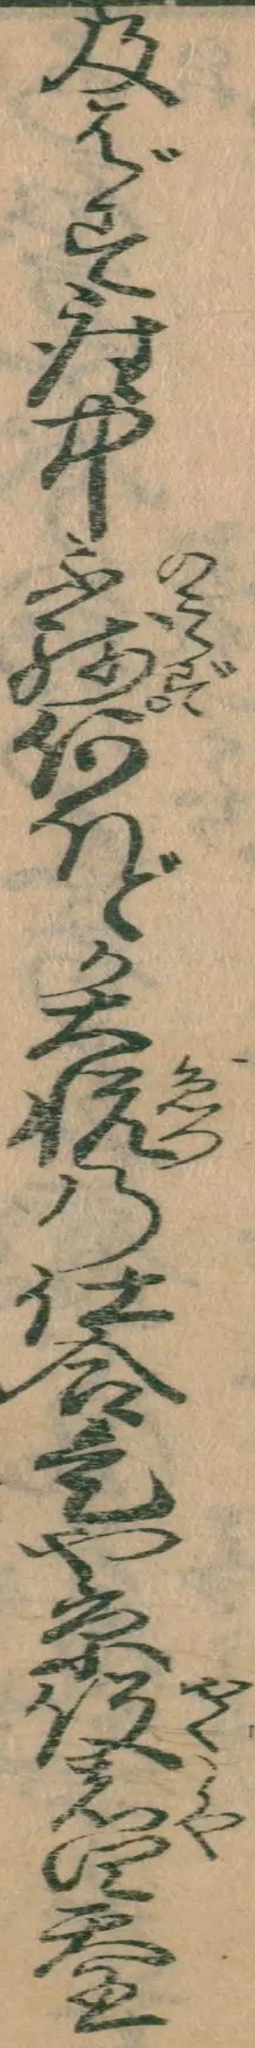及ばす座中不残。何ほどか大悦の仕合是や京役者四天王
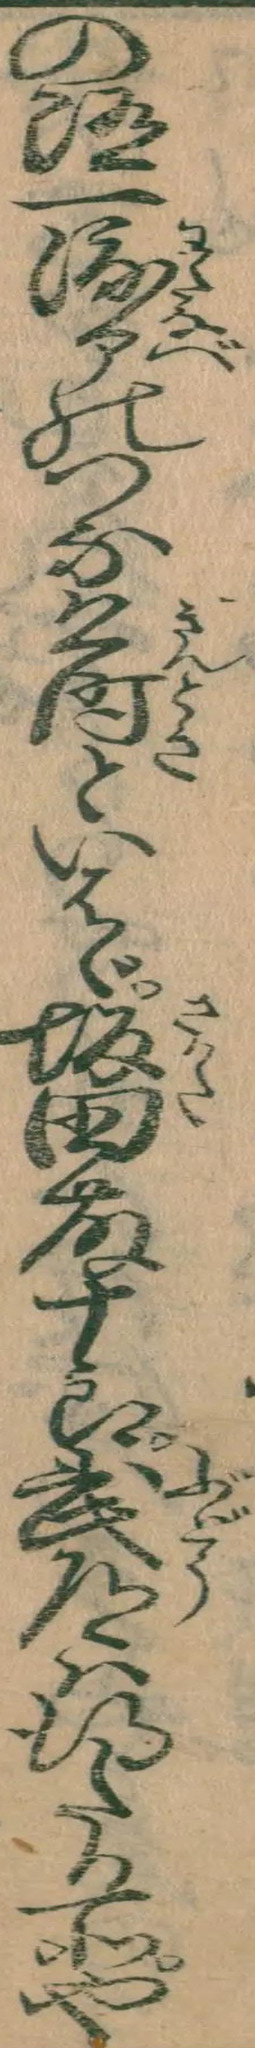の随一渡部のつな公時といはゞ。坂田藤十郎。武道は得たる所。や
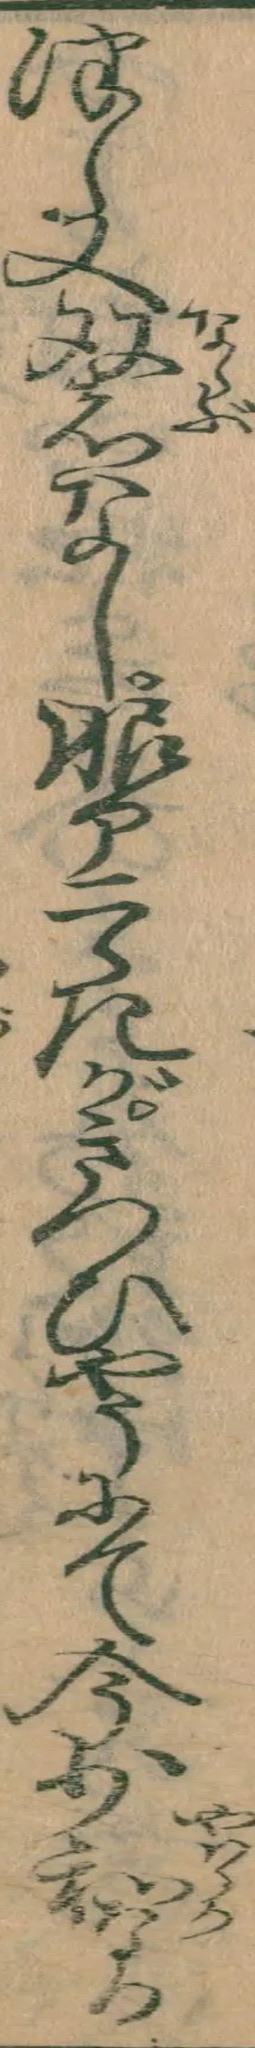つし又双名なし。服部二郎左が。きつひやうにて今少和なる
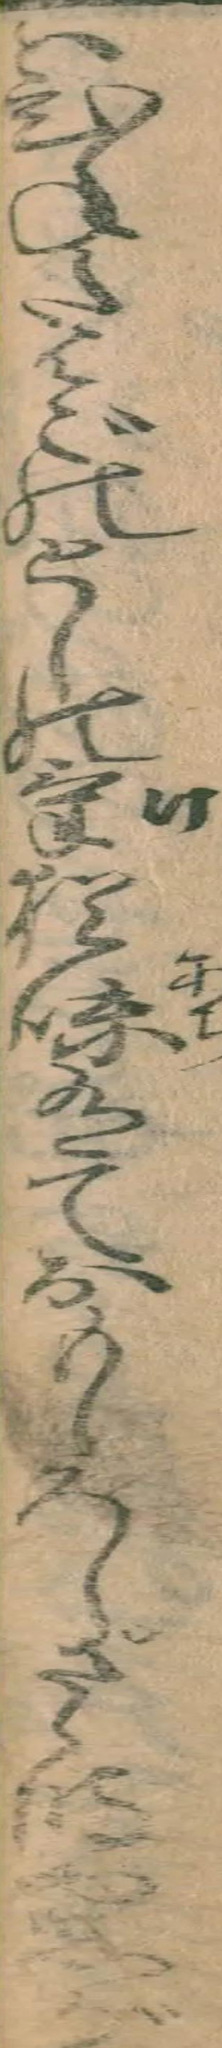はひねたはごのとしの気猶味有ておもしろし。さゝなが

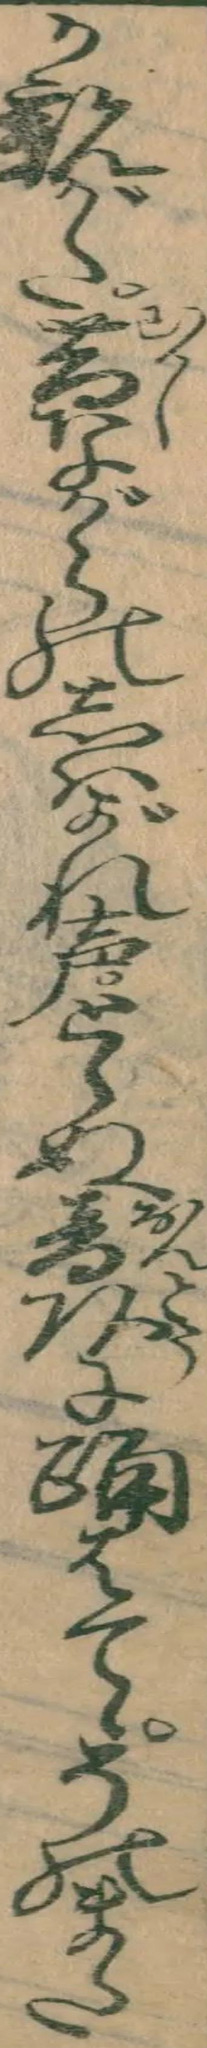か親がた。昔ながらのしはがれ声。とらぬ音頭に踊はてゝ。そのまた
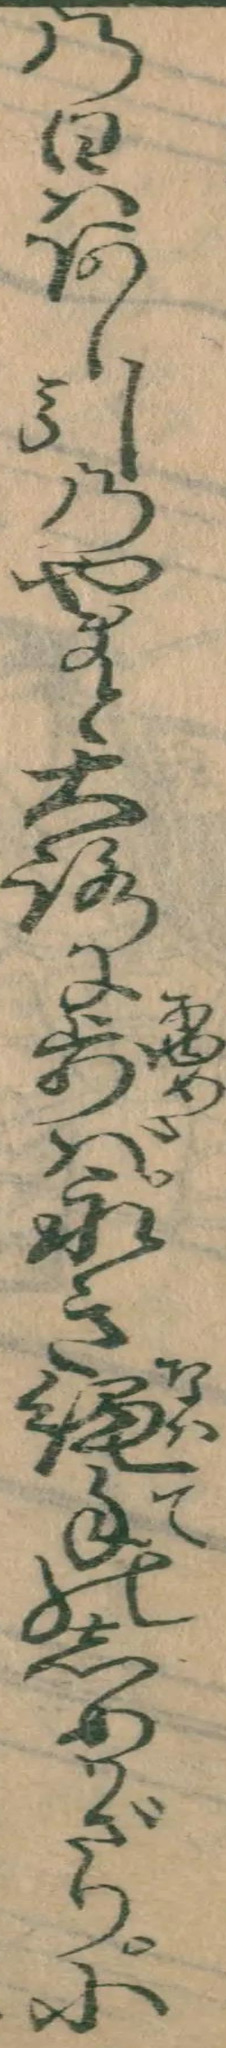の日はあし引のやまと大路に歩ば。永き縄手のしめかざり。小
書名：新竹斎 5巻
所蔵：国立国会図書館 National Diet Library, JAPAN
